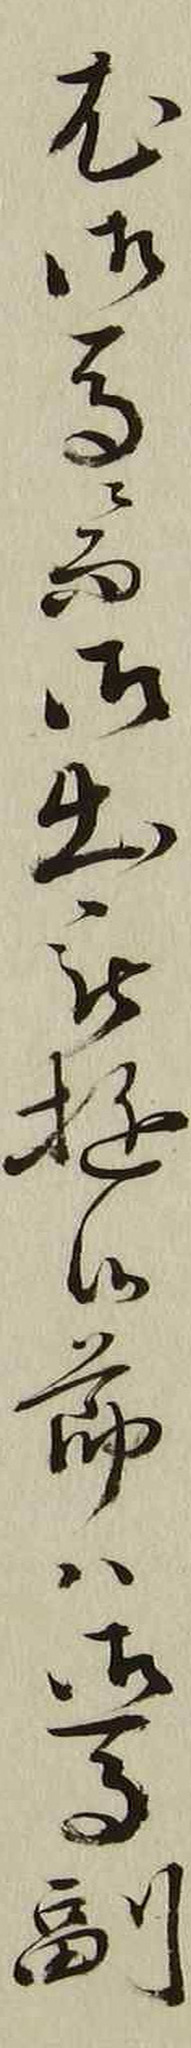尤御馬ニ而御出被遊候節ハ御馬副
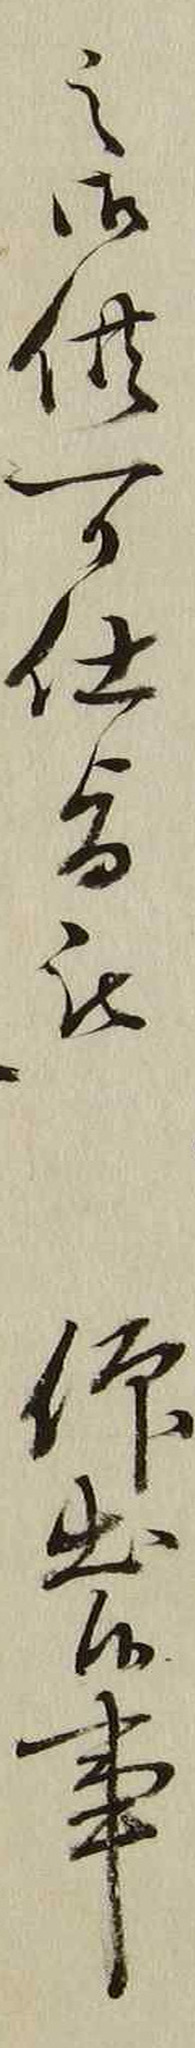之御供可仕旨被仰出候事
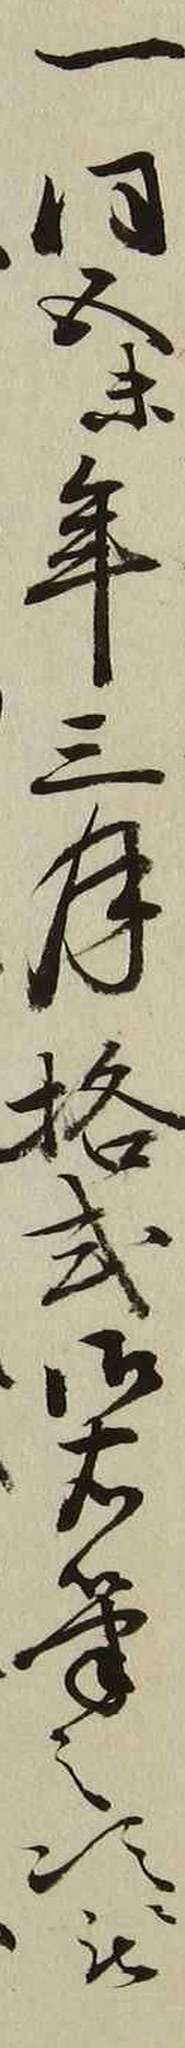一同五未年三月格式御右筆之次ニ被
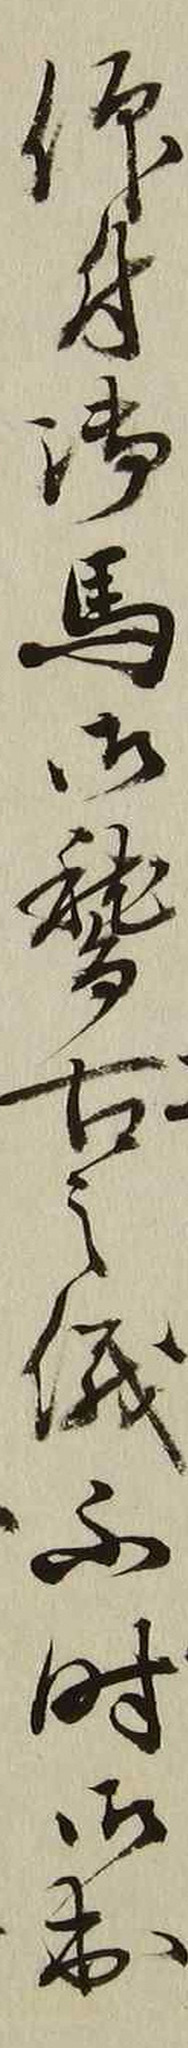仰付御馬御稽古之儀不時御出
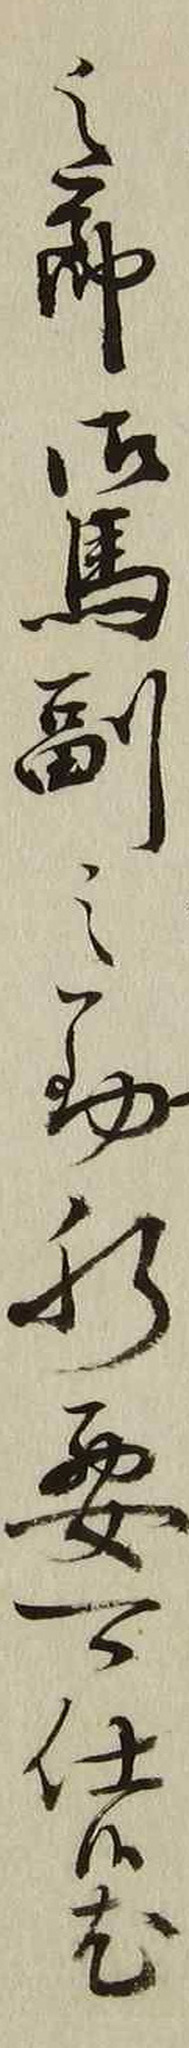之節御馬副之勤肝要可仕候尤
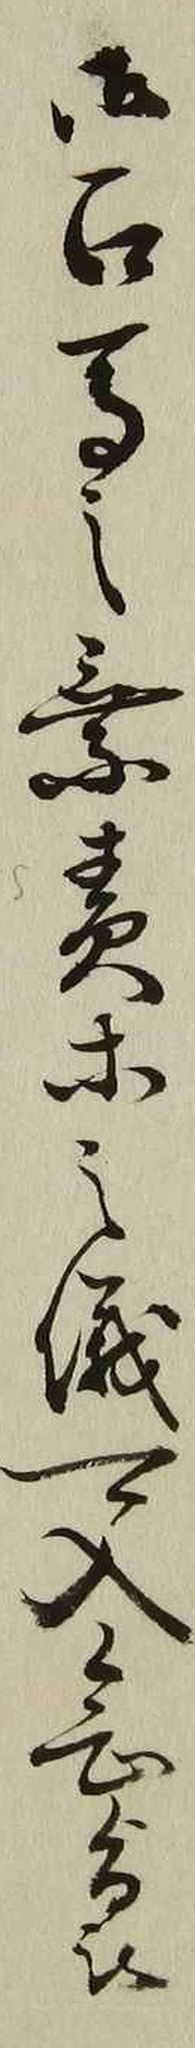御召馬之乗責等之儀可入念旨被
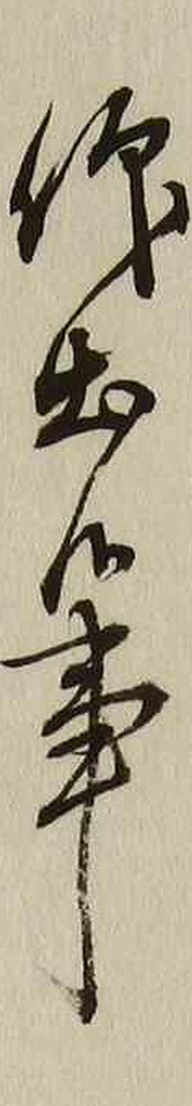仰出候事
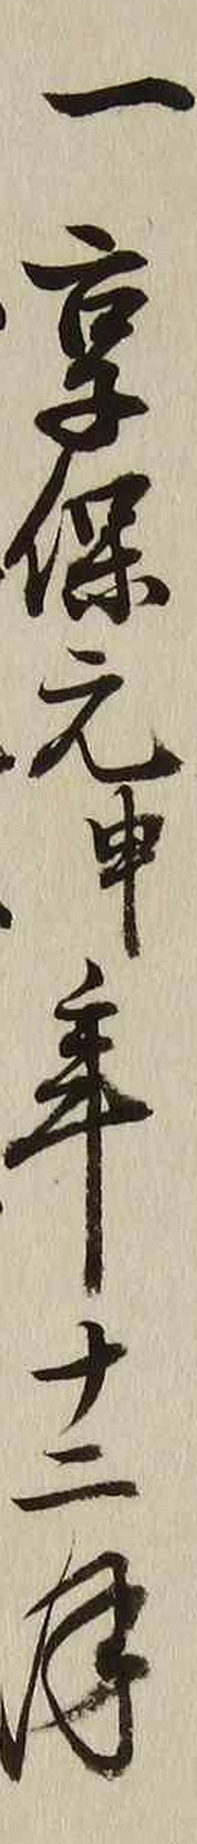一享保元申年十二月
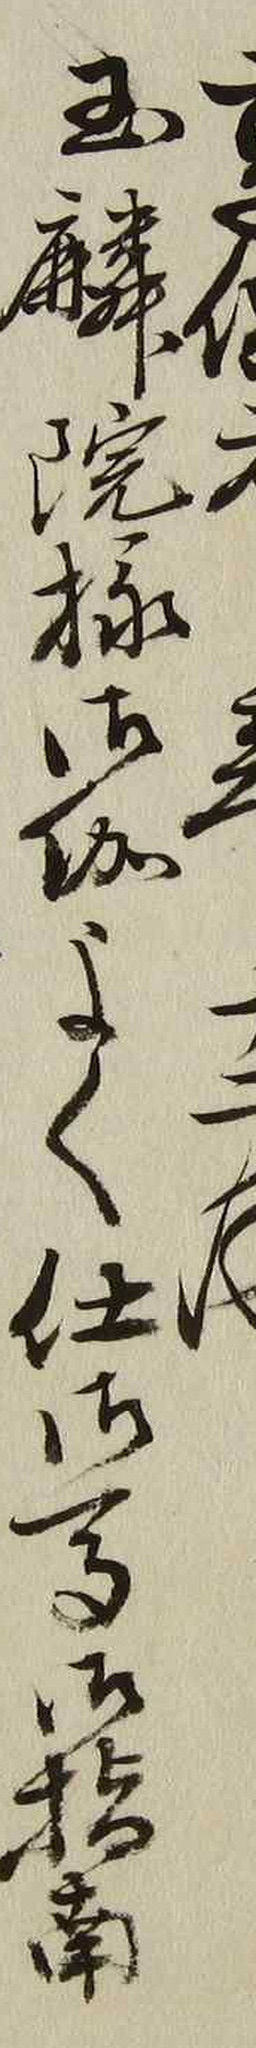玉鱗院様御伽よく仕御馬御指南
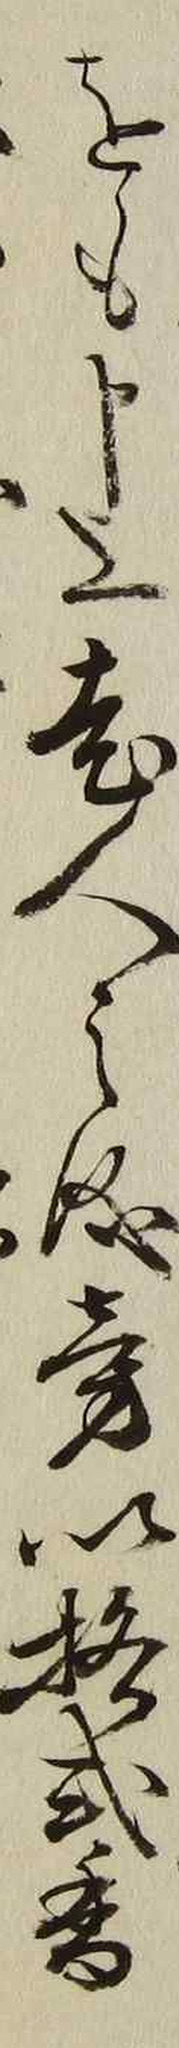をも申上老人之儀旁以格式香
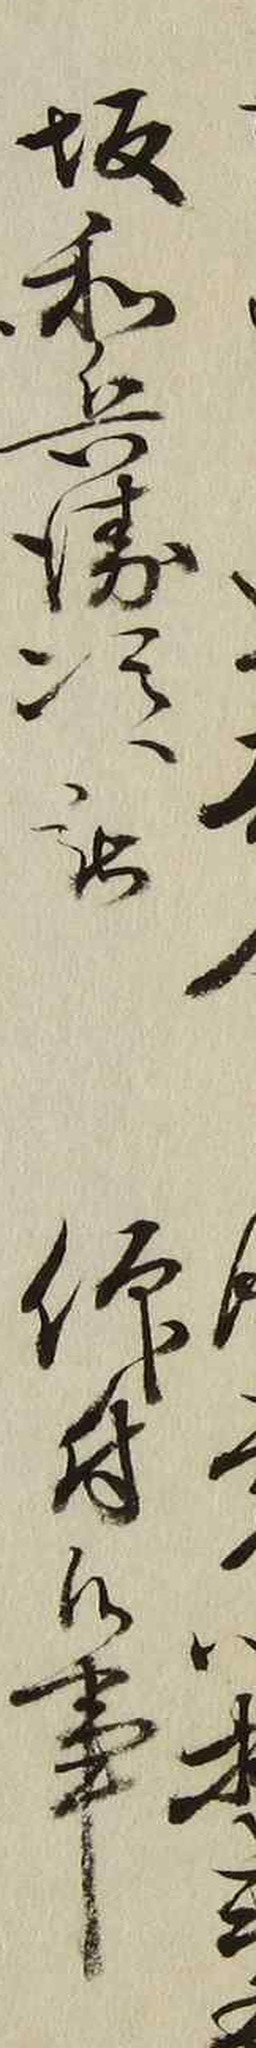坂和兵衛次へ被仰付候事
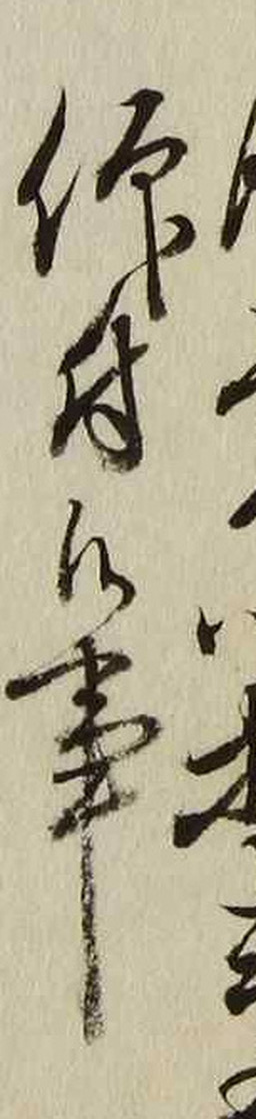仰出候事
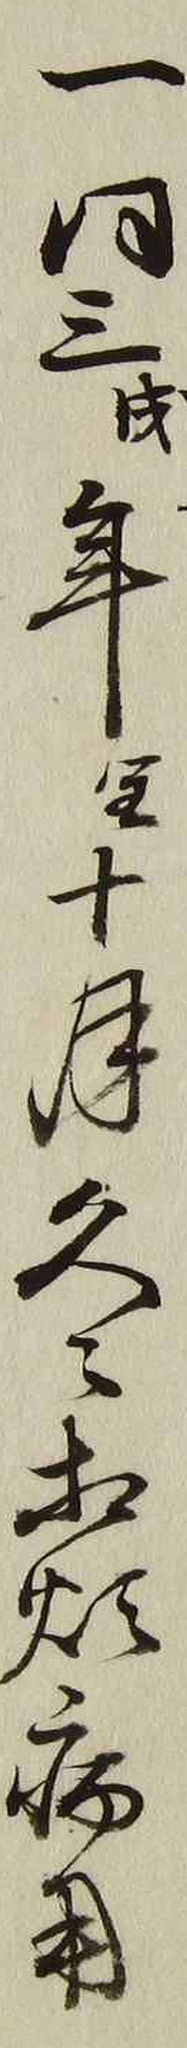一同三戌年閏十月久々相煩病用
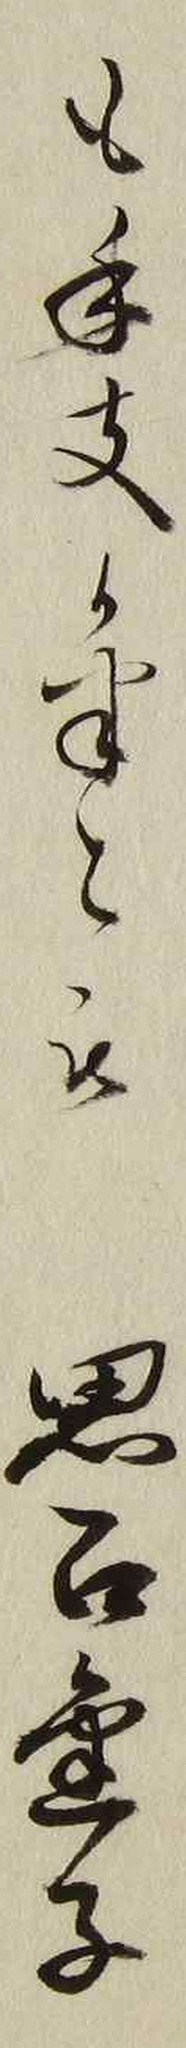も手支候半と被思召金子
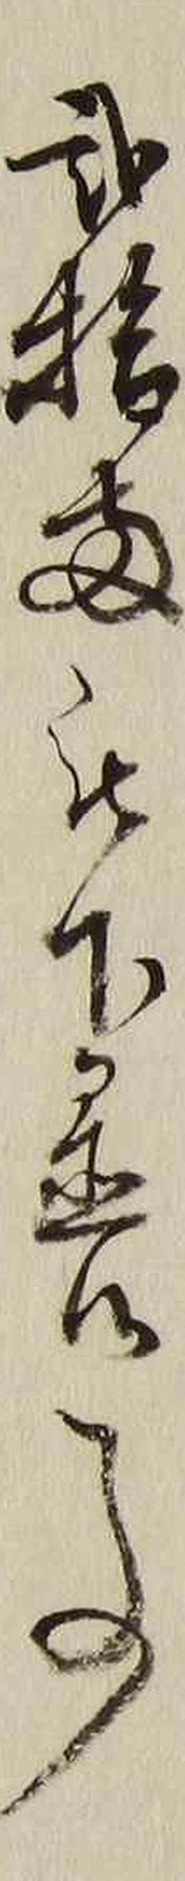弐拾両被下置候事
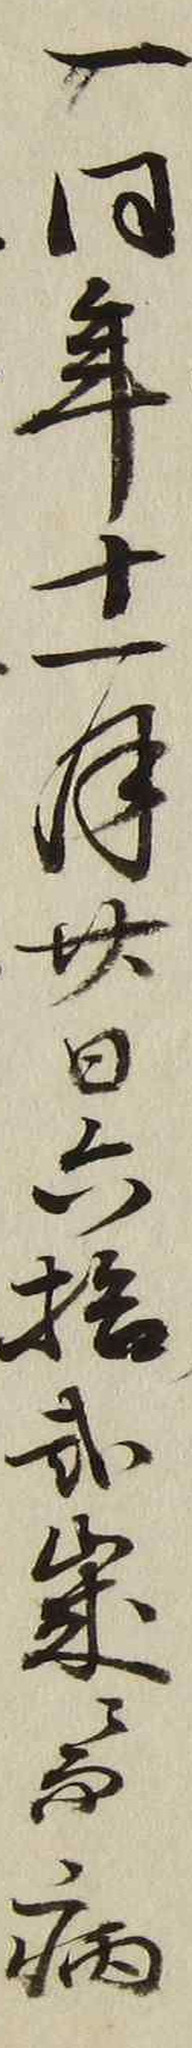一同年十一月廿日六拾弐歳ニ而病
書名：諸士系譜　巻之35　は之部3
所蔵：会津若松市立会津図書館
